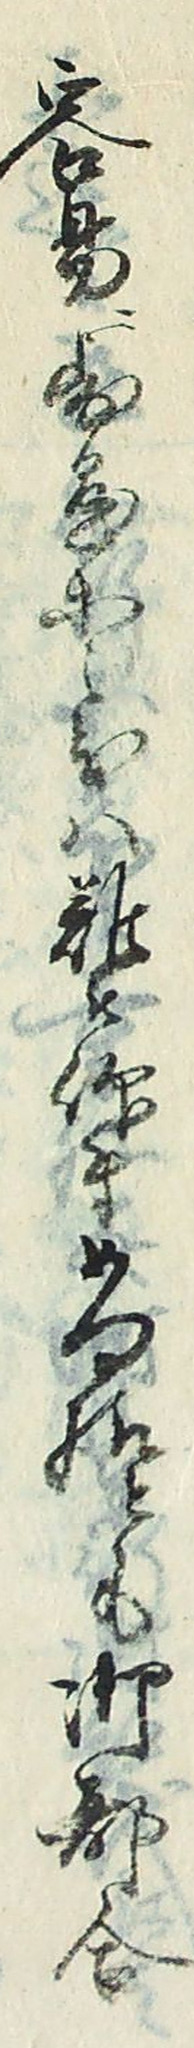容易ニ歩懸等之義ハ難被仰付如何様とも御都合
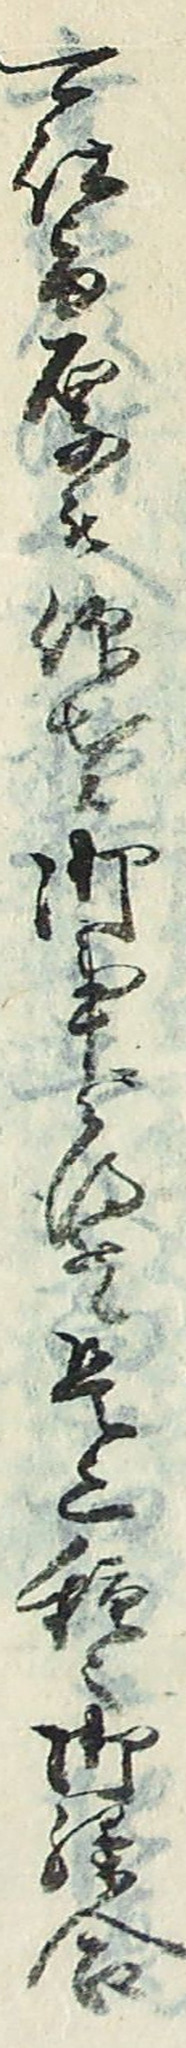可仕旨厚被仰出候御事ニ候得共是迄種々御繰合
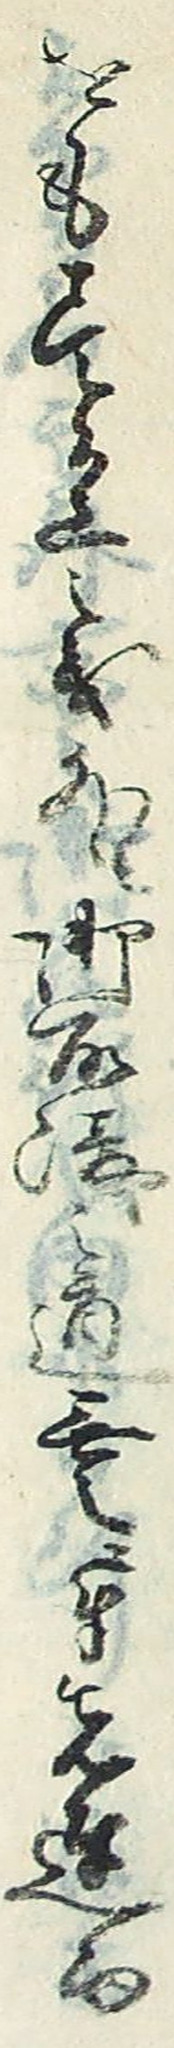をも尽候上之義外ニ御取凌之道無之ニ付先達

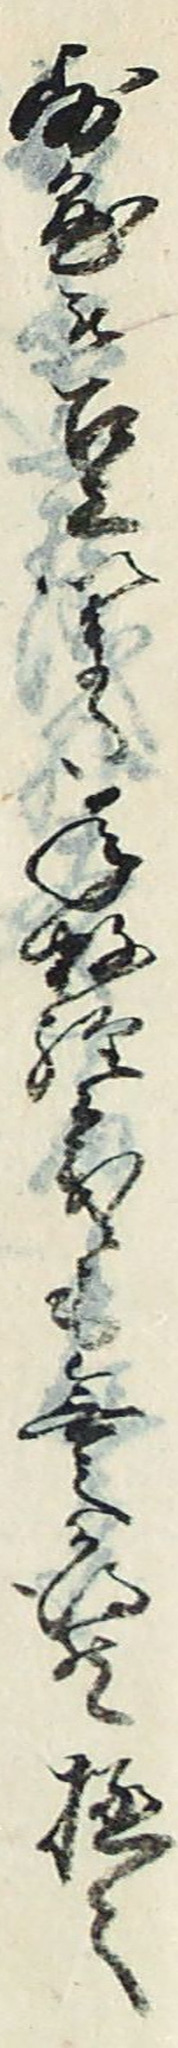歩懸被召上いまた年数経候義ニも無之候得共極々
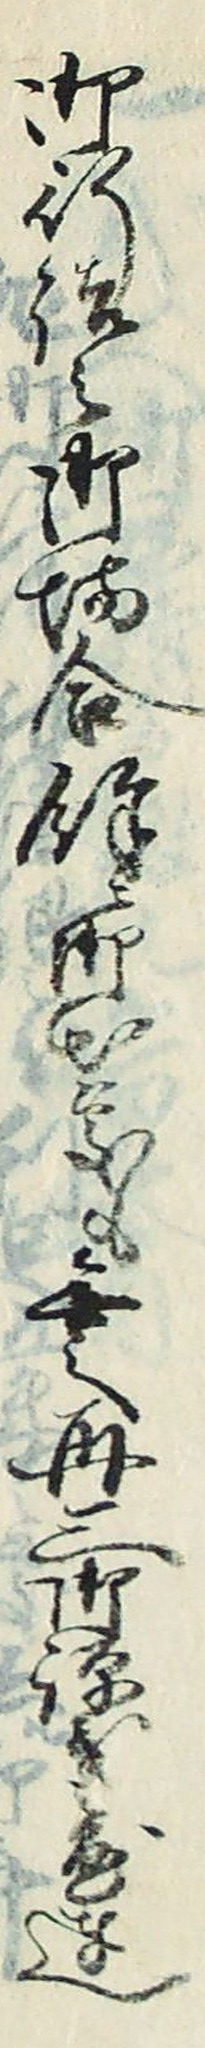御行詰之御場合餘ニ御出處も無之再三御評義之懸達
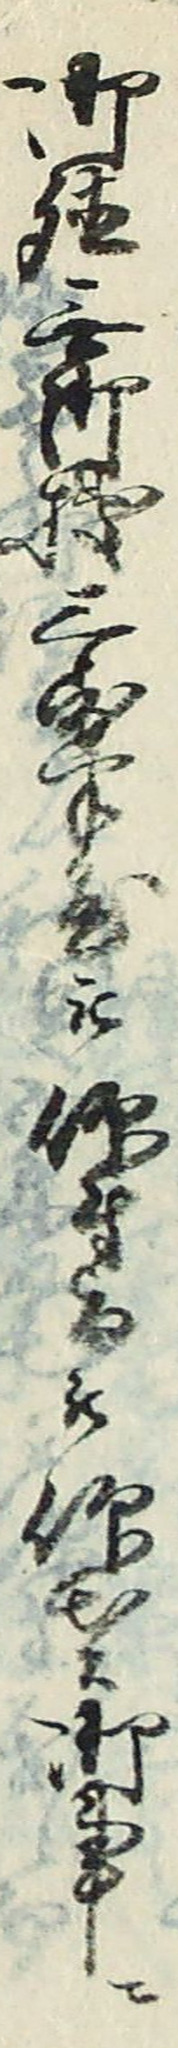御聴無御據三歩半懸被仰付旨被仰出候御事ニ
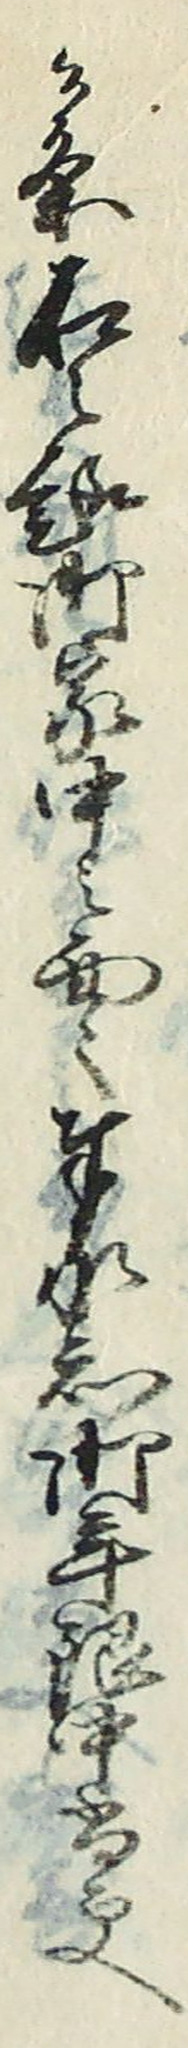候条右之趣御家中之面々奉承知御年限中尚更
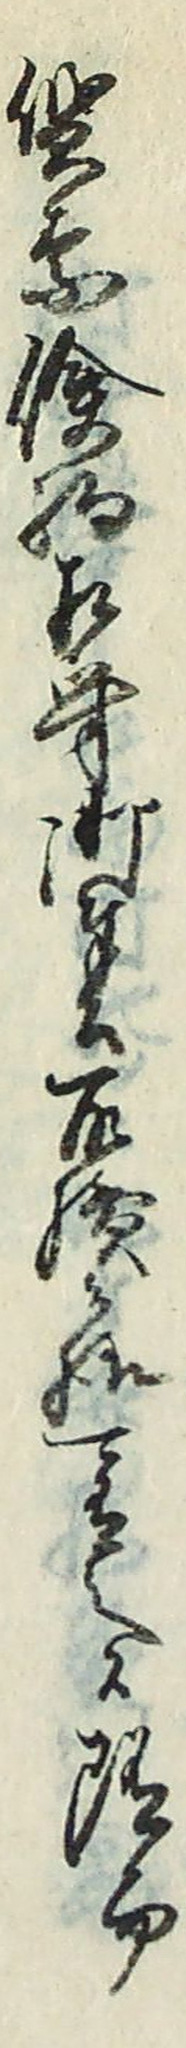質素倹約相守御奉公取續候様可有之候随而
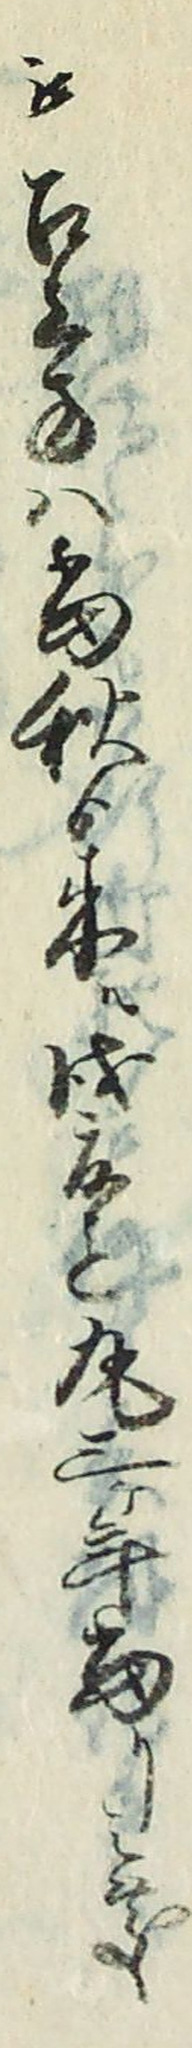被召上方ハ當秋ゟ来ル戌夏迄丸三ヶ年當り之處
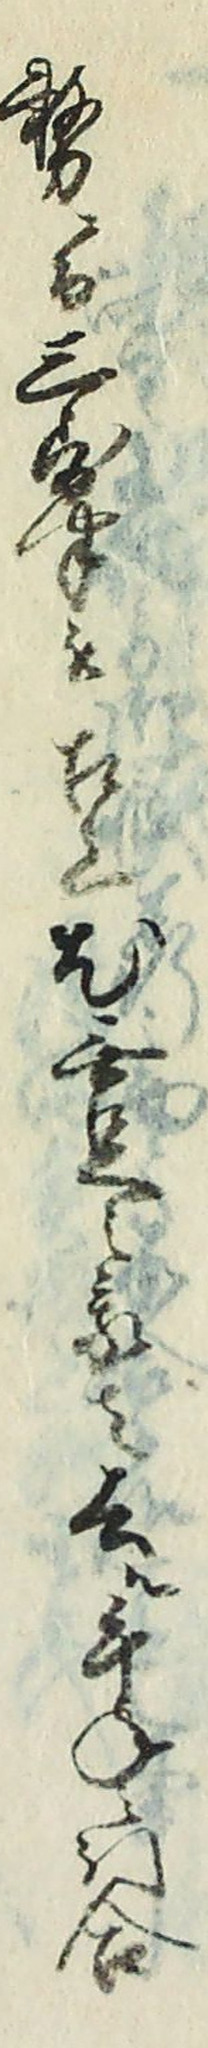務ニ而三歩半被召上尤無足之義者去ル午年之引合
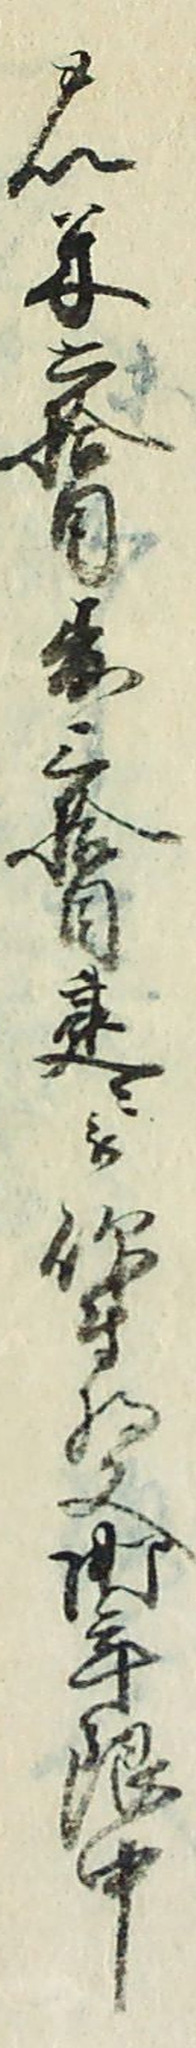ヲ以米六拾目麦三拾目建ニ被仰付将又御年限中
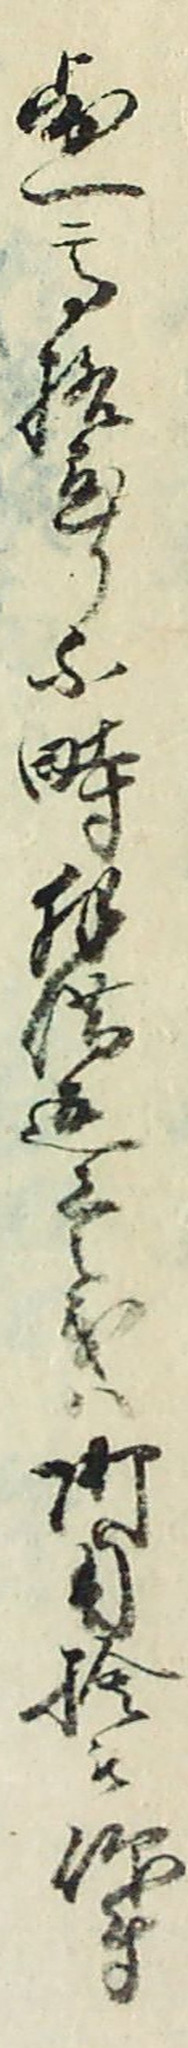歩一高格懸り不時拝借返上之義ハ御用捨被仰付
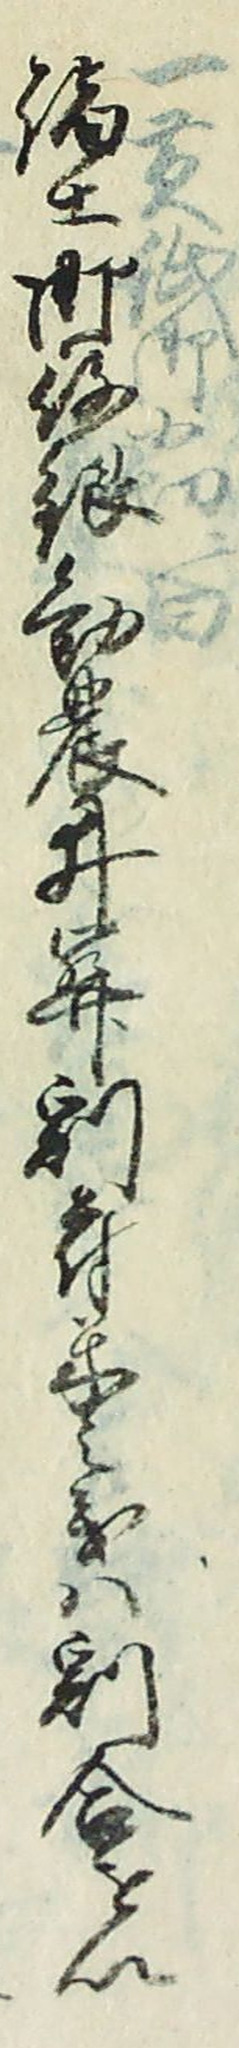諸士御役銀勧農井関割符米之義ハ割合を以
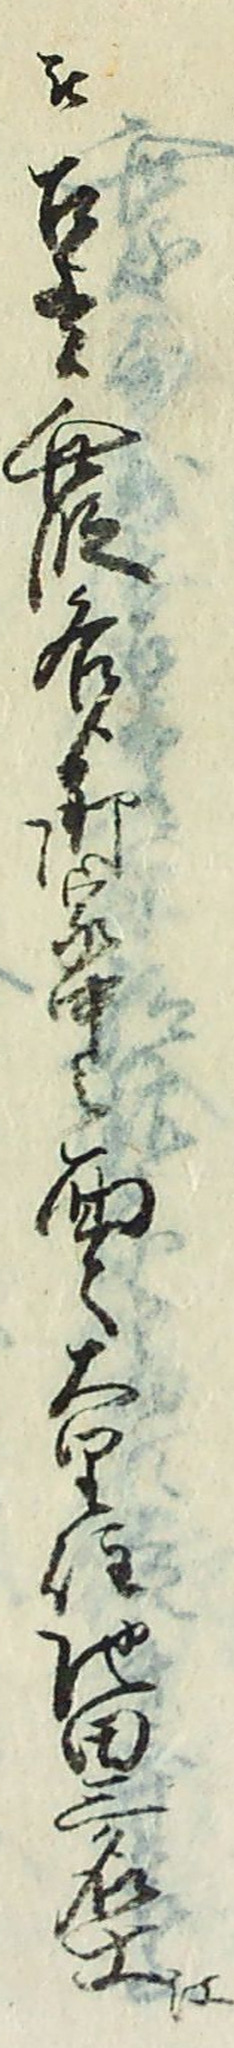被召上候此段各ゟ御家中之面々大里住池田三名士江
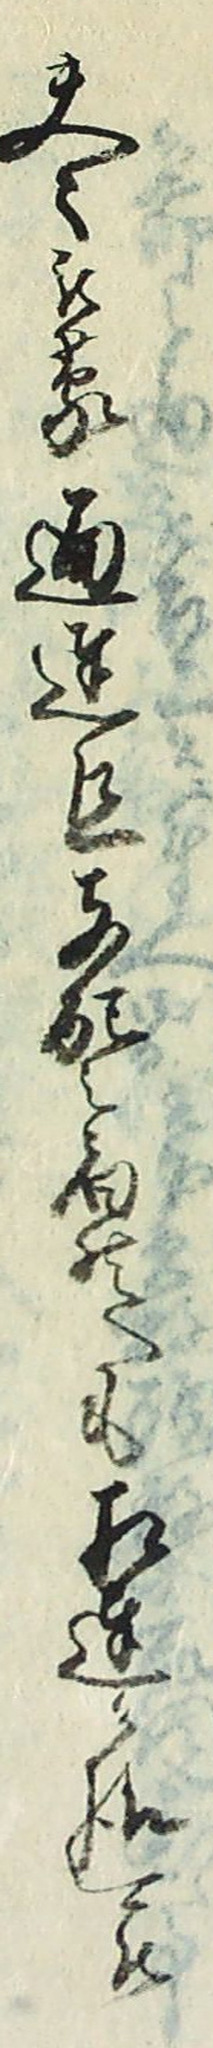夫々被蒙通達且支配之者共へも相達候様可被
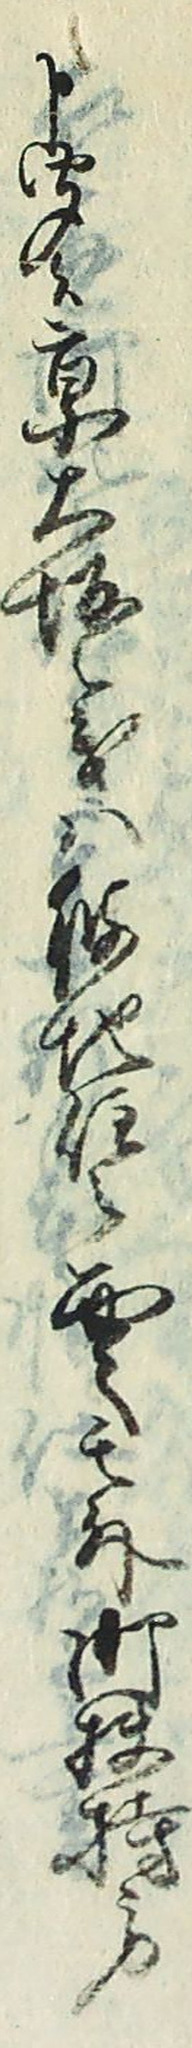申聞候京大坂之義ハ彼地住之面々其外御扶持方
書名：諸御趣意書并御下知向之写
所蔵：鳴門教育大学 Naruto University of Education
